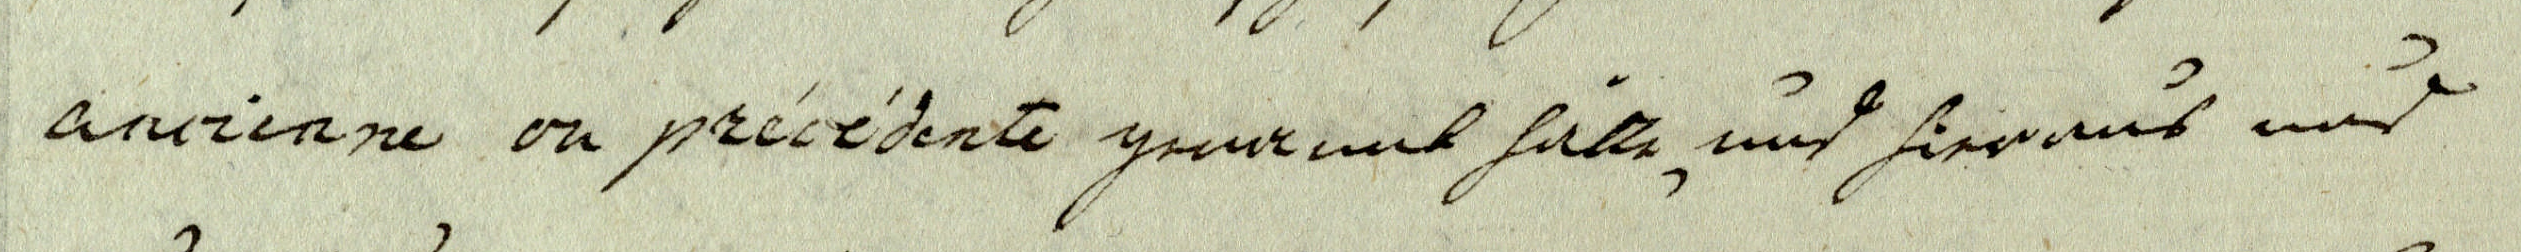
ancienne on précédente genannt hätte, und hieraus und
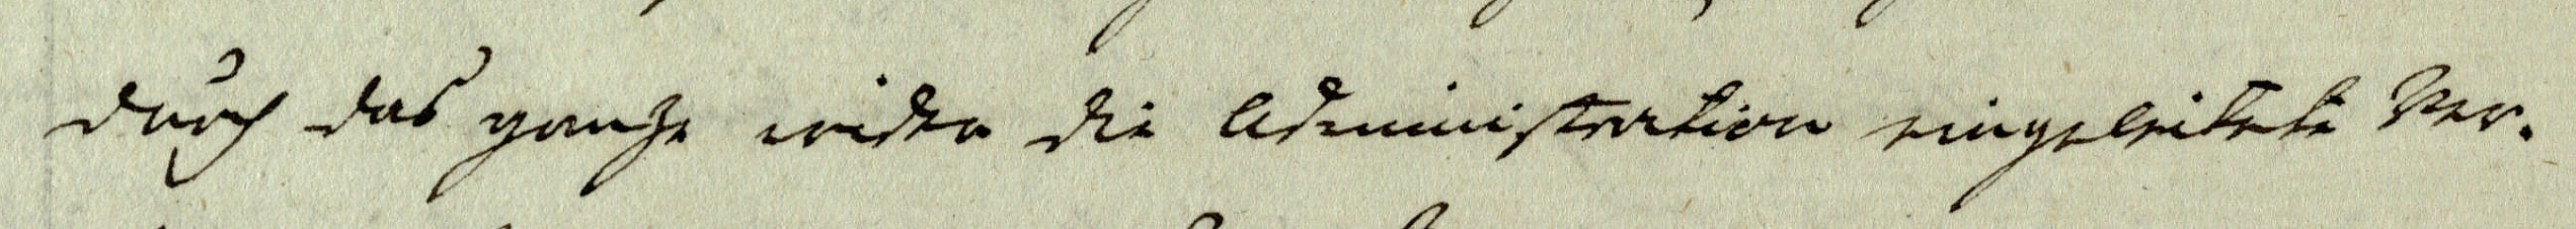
durch das ganze wider die Administration eingeleitete Ver¬
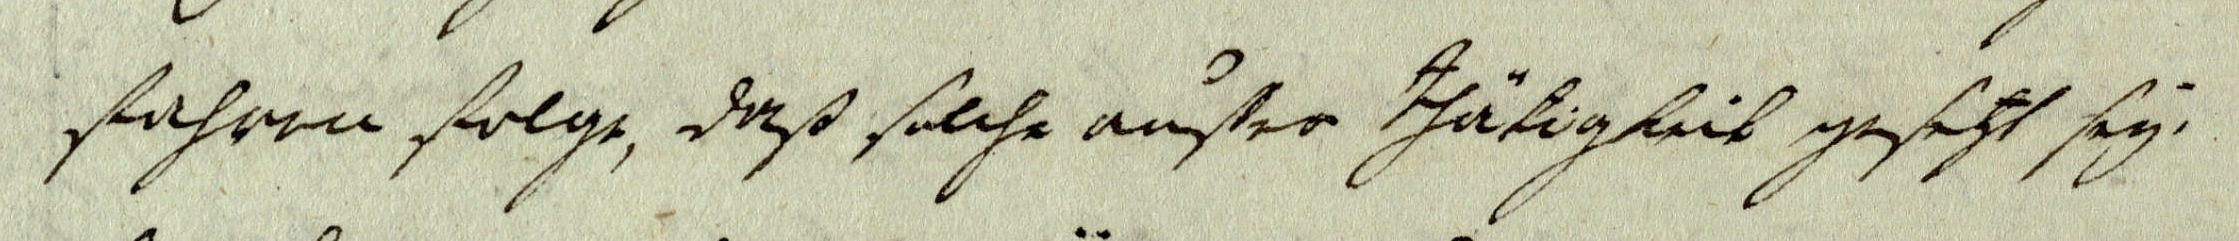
fahren folge, daß solche ausser Thätigkeit gesetzt seÿ.
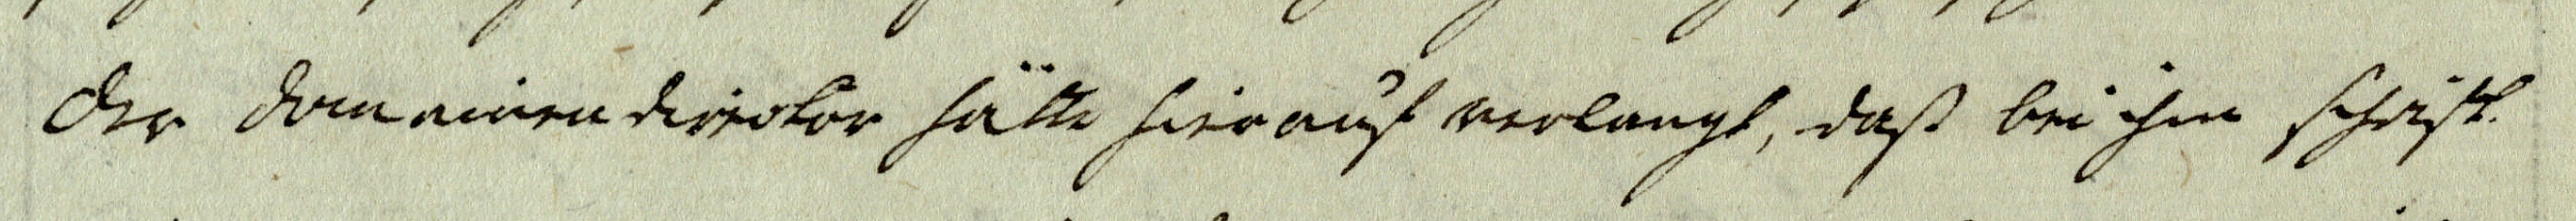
Der Domainendirector hätte hierauf verlangt, daß bei ihm schrift¬
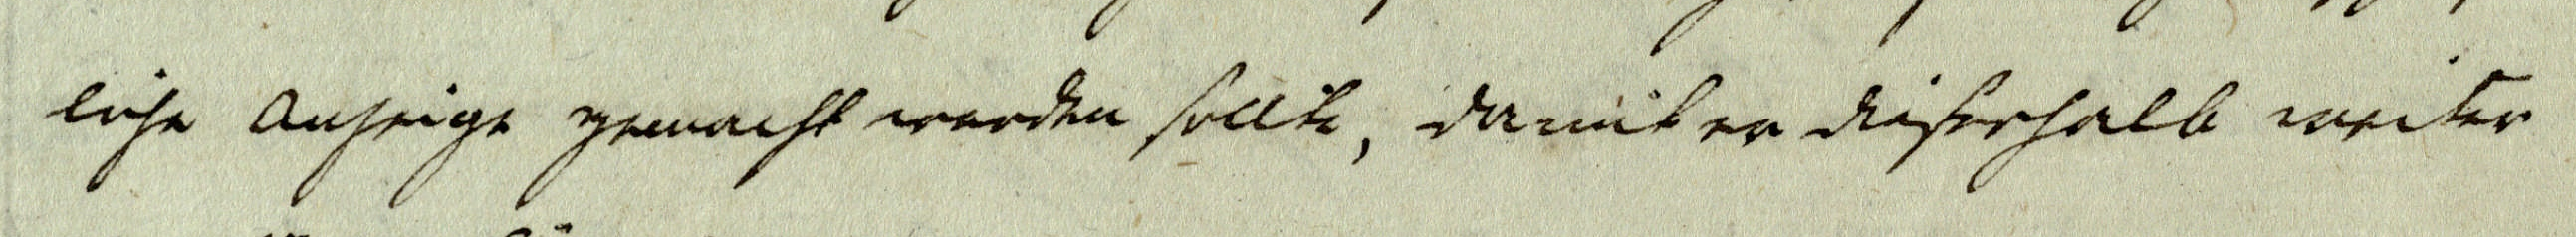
liche Anzeige gemacht werden sollte, damit er dieserhalb weiter
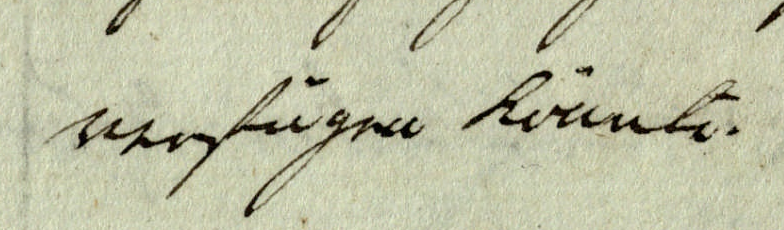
verfügen könnte.
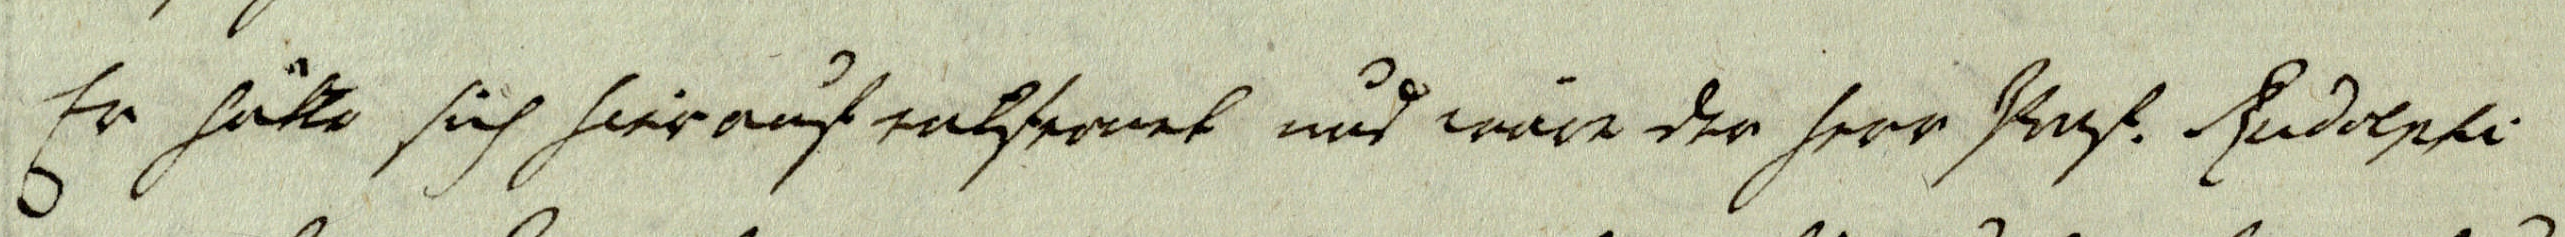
Er hätte sich hierauf entfernet und wäre der Herr Prof. Rudolphi
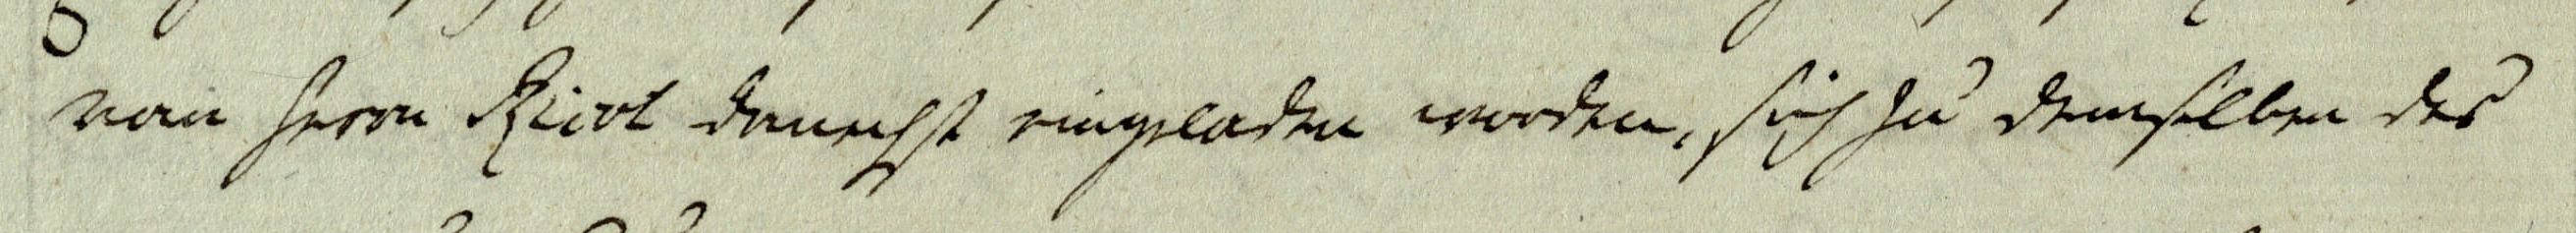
von Herrn Ricot danechst eingeladen worden, sich zu demselben des
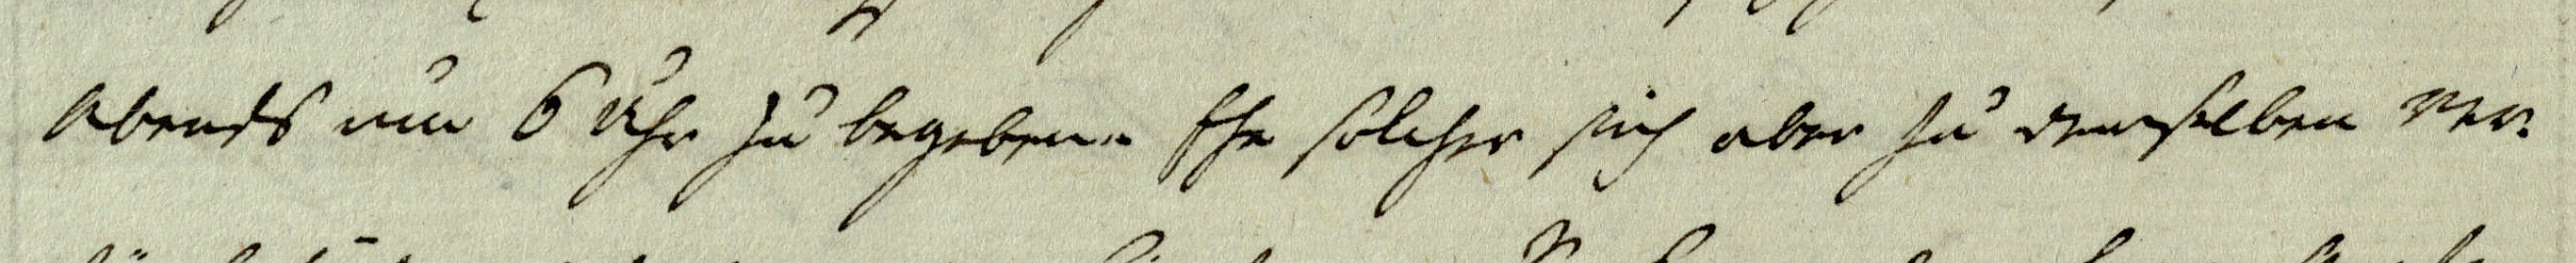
Abends um 6 Uhr zu begeben. Ehe solcher sich aber zu demselben ver¬
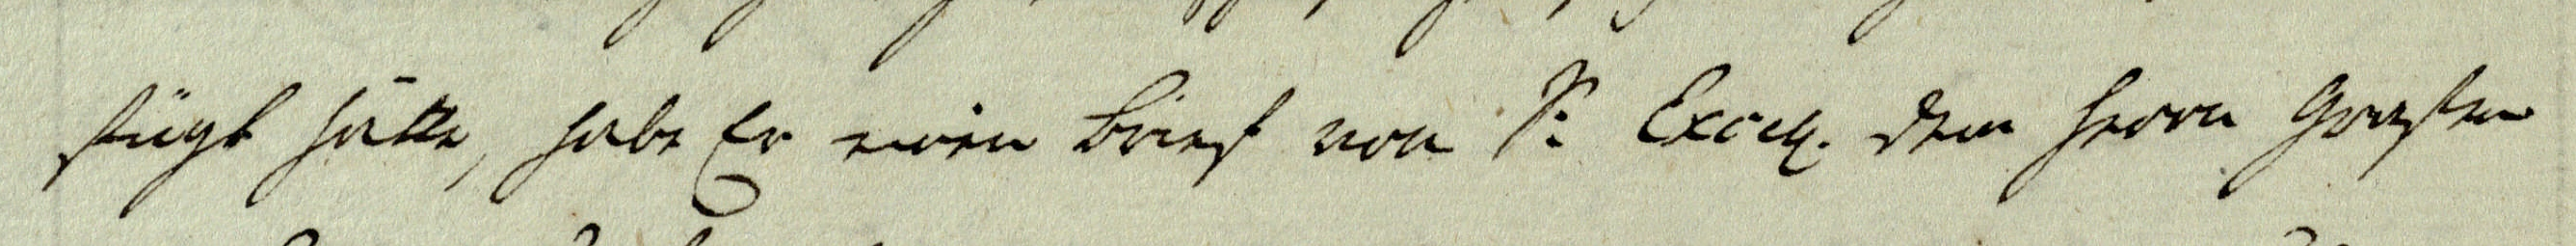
fügt hätte, habe Er einen Brief von Sr. Excell. dem Herrn Grafen
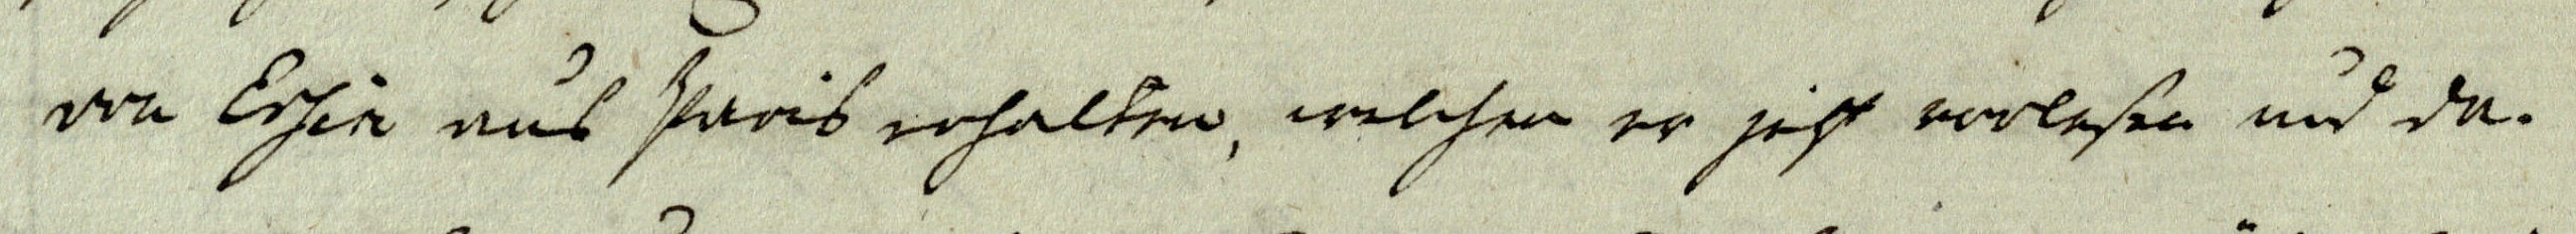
von Essen aus Paris erhalten, welchen er jetzt vorlesen und da¬
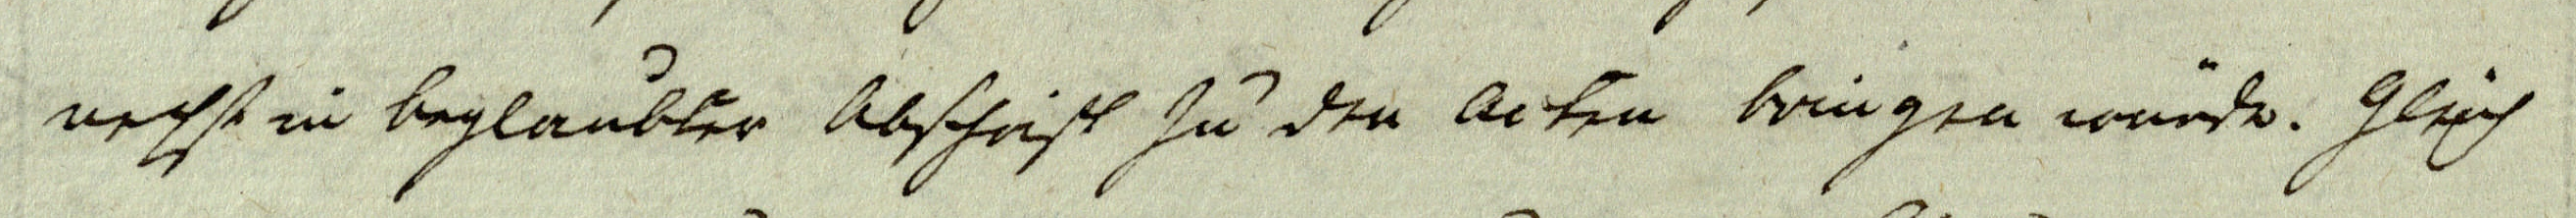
nechst in beglaubter Abschrift zu den Acten bringen würde. Gleich
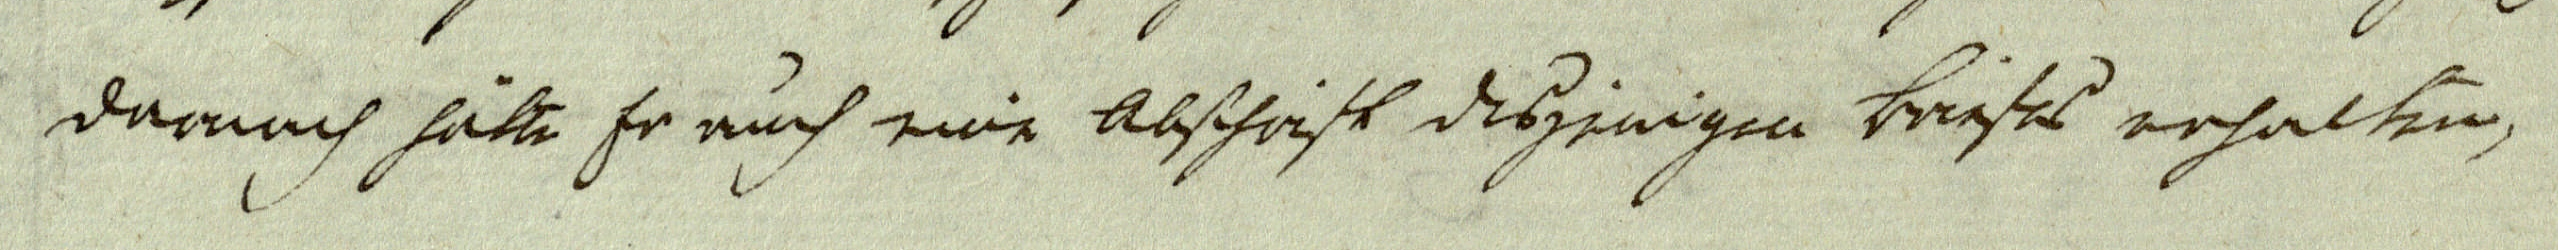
darnach hätte Er auch eine Abschrift desjenigen Briefes erhalten,
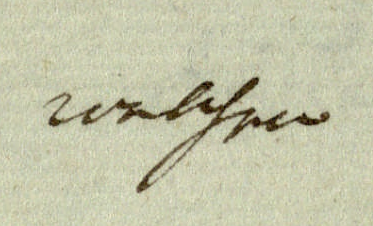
welchen
